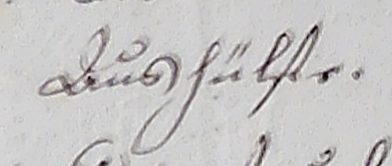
Aushülfe.
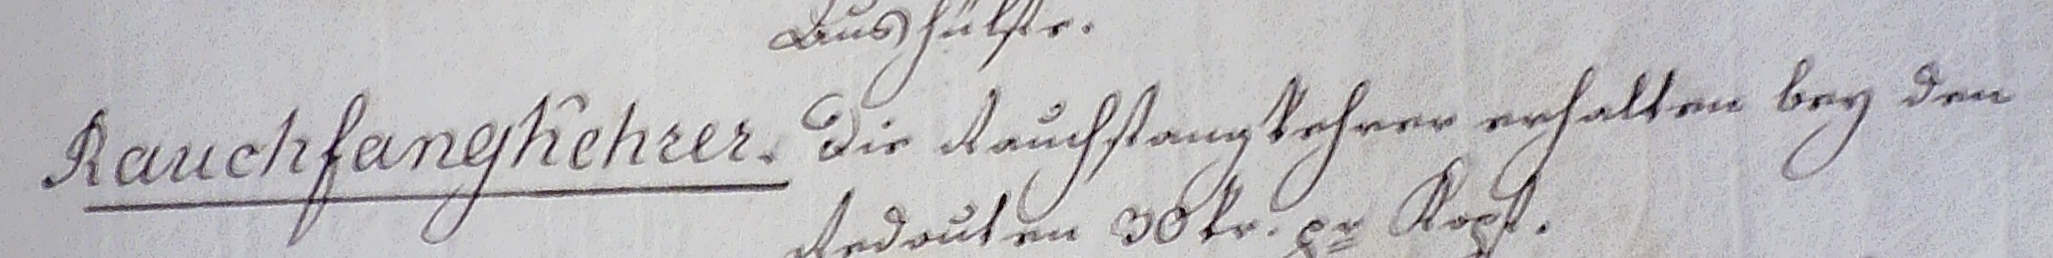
Rauchfangkehrer. Die Rauchfangkehrer erhalten bey den
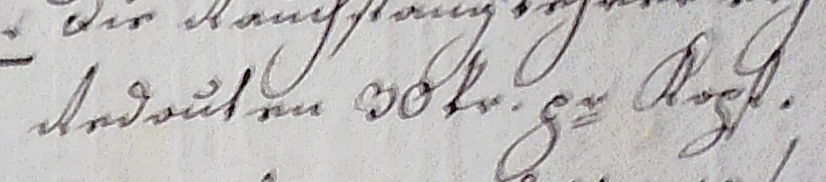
Redouten 30kr. pr͇ Kopf.
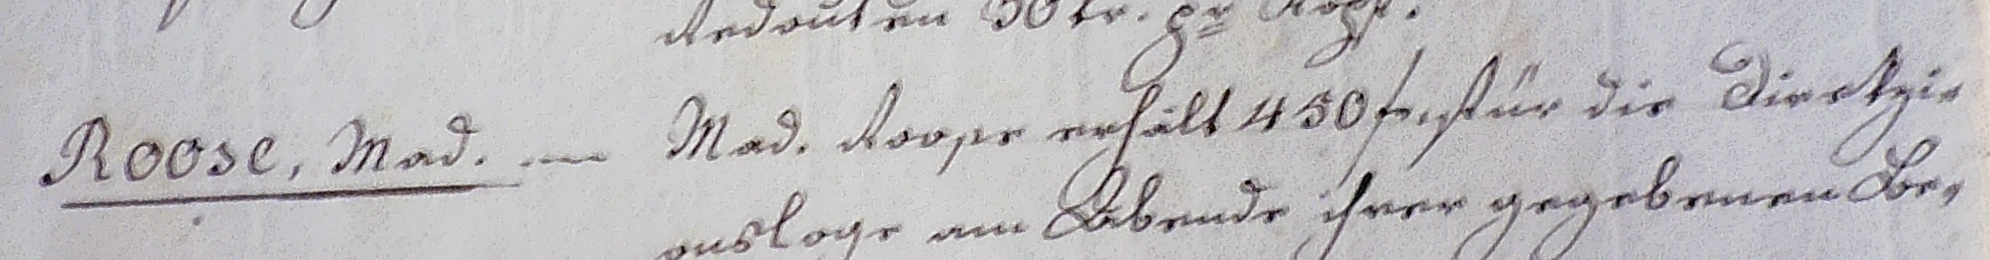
Roose, Mad. .... Mad. Roose erhält 450fr. für die Direkzi¬
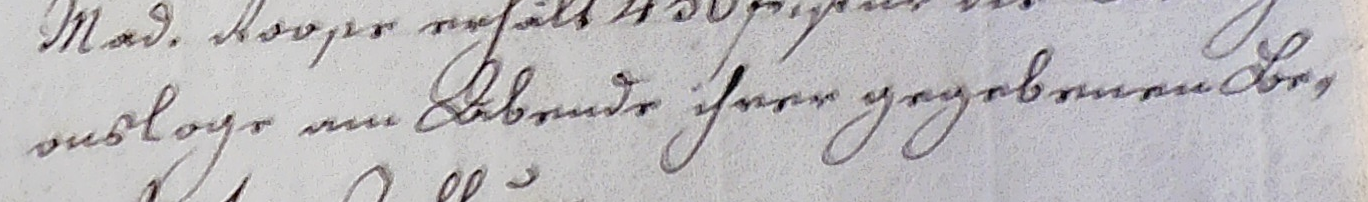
onsloge am Abende ihrer gegebenen Be¬
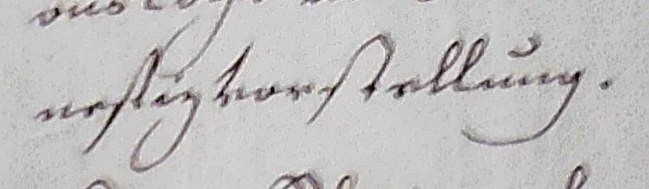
nefizvorstellung.
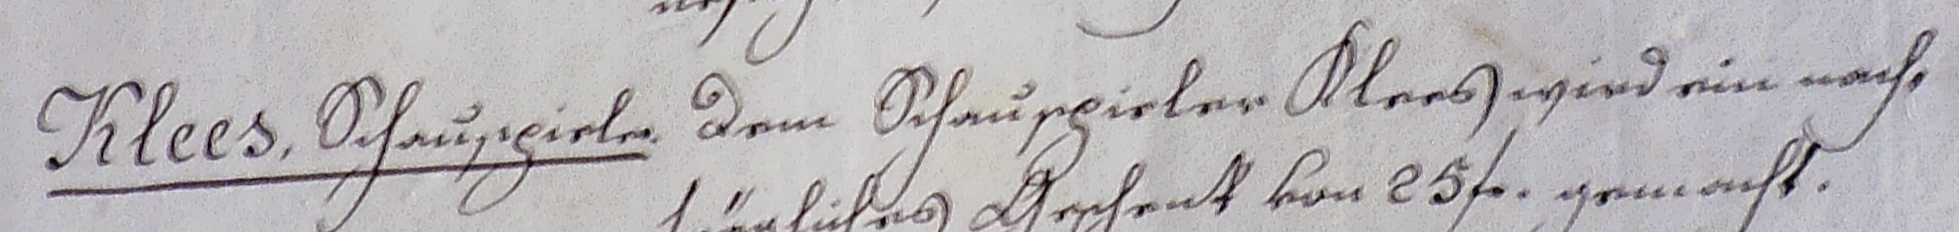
Klees, Schauspieler. Dem Schauspieler Klees wird ein nach¬
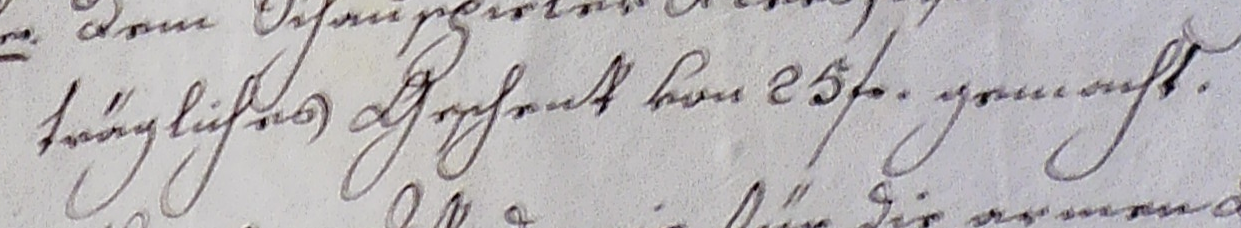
trägliches Gehalt von 25fr. gemacht.
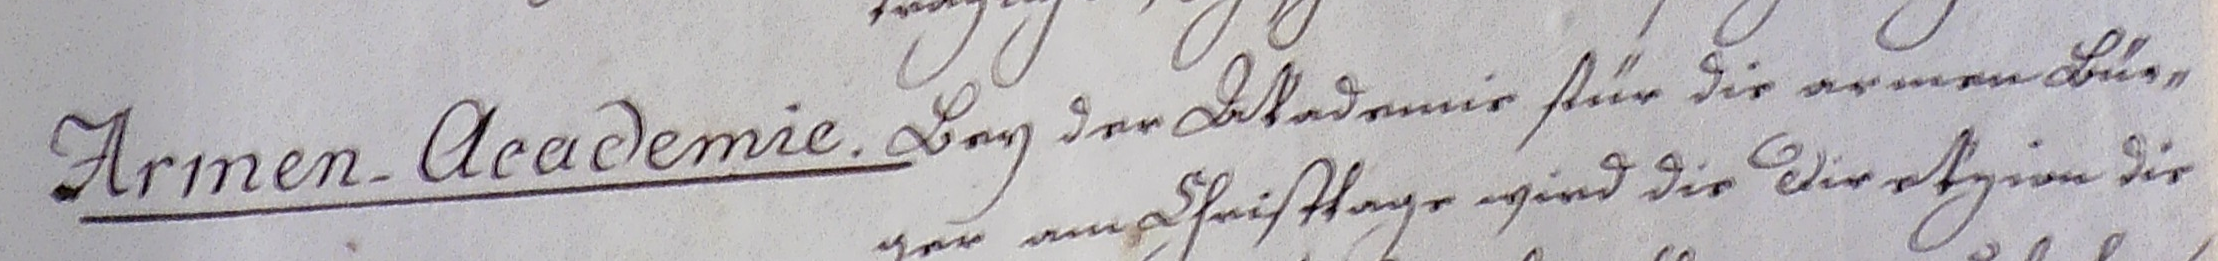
Armen‗ Academie. Bey der Akademie für die armen Bür¬
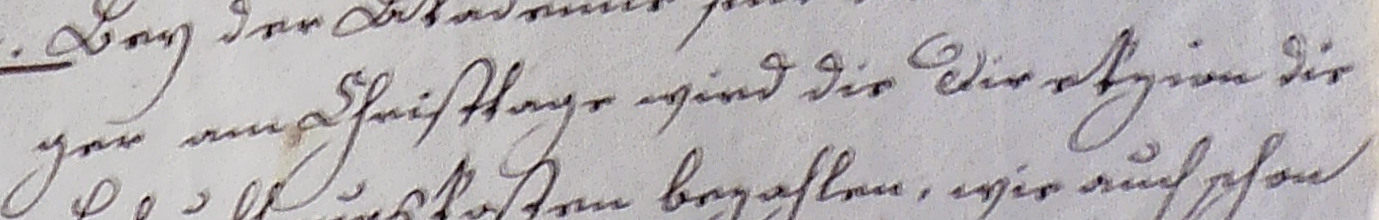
ger am Christtage wird die Direkzion die
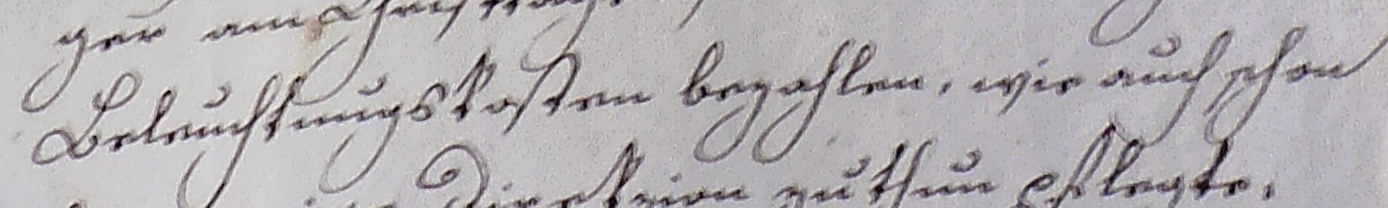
Beleuchtungskosten bezahlen, wie auch schon
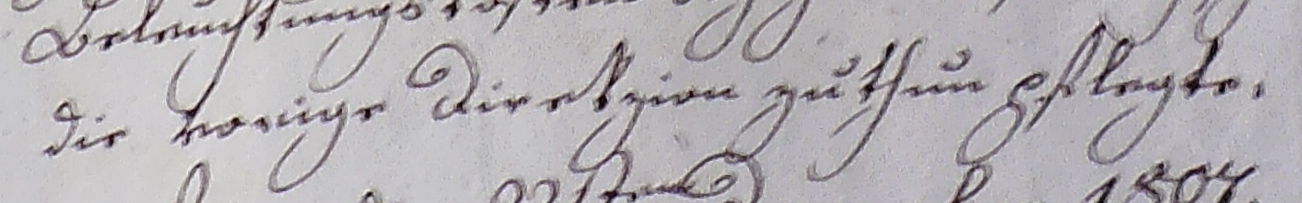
die vorige Direkzion zuthun pflegte.
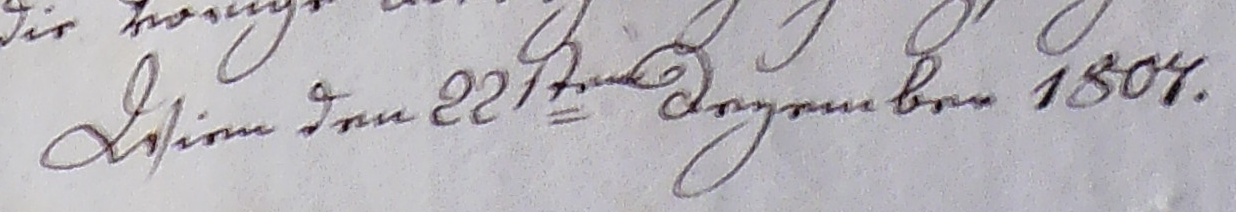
Wien den 22ste͇n Dezember 1807.
